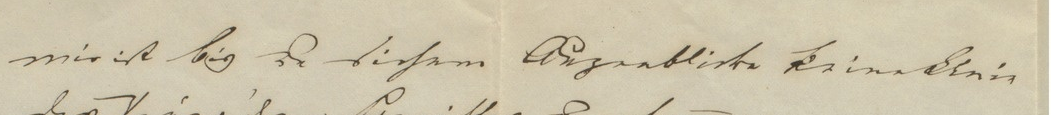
mir ist bis zu diesem Augenblicke keine Linie
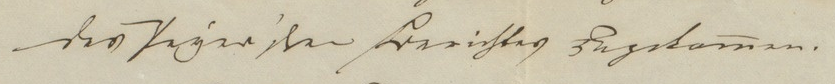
des Peyer'schen Berichtes zugekommen.
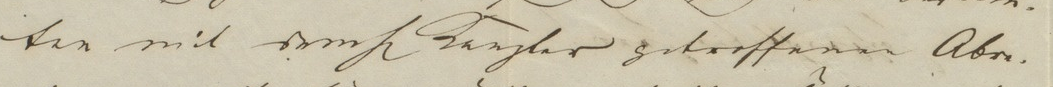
ten mit dem Herrn Kanzler getroffenen Abre-
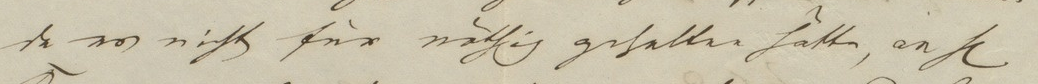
de es nicht für nöthig gehalten hätte, an Herrn
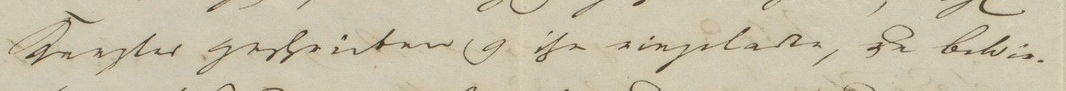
Kanzler geschrieben & ihn eingeladen, zu bewir-
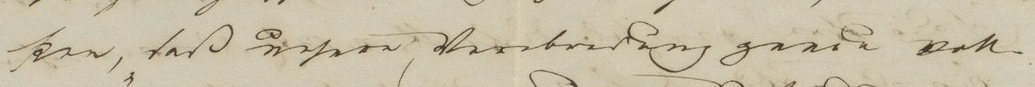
ken, «daß unsere Verabredung genau voll-
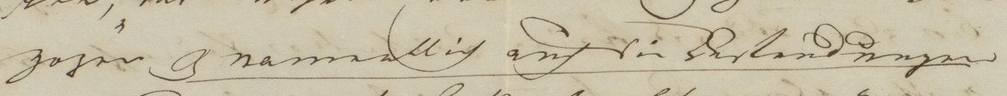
zogen & namentlich auch die Zusendungen
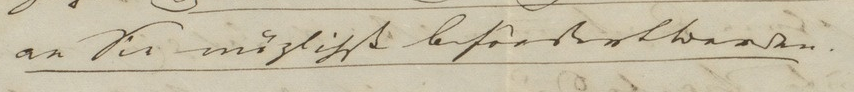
an Sie möglichst befördert werden.»
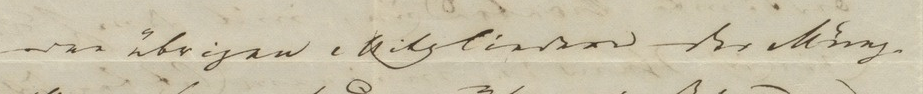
Den übrigen Mitgliedern der Münz-
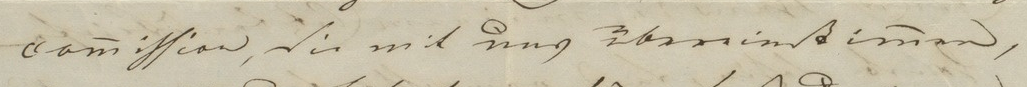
commission, die mit uns übereinstimmen,
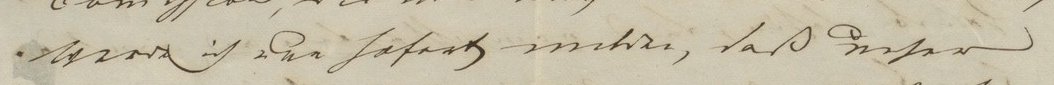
werde ich nun sofort melden, daß unser
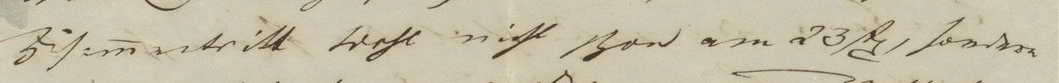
Zusammentritt wohl nicht schon am 23sten , sondern
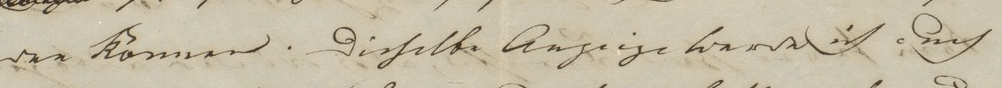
den können. Dieselbe Anzeige werde ich auch
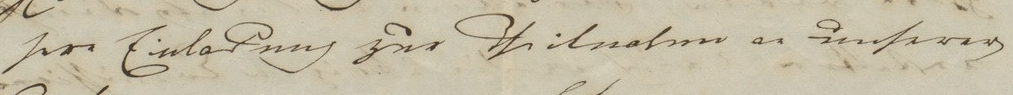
sere Einladung zur Theilnahme an unserer
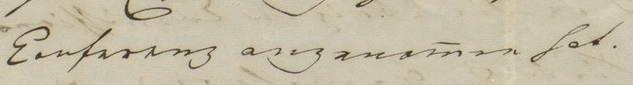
Conferenz angenommen hat.
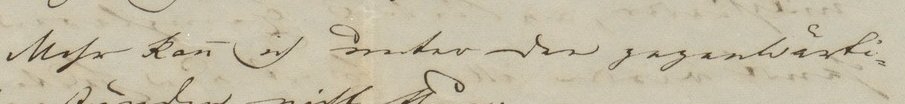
Mehr kann ich unter den gegenwärti-
